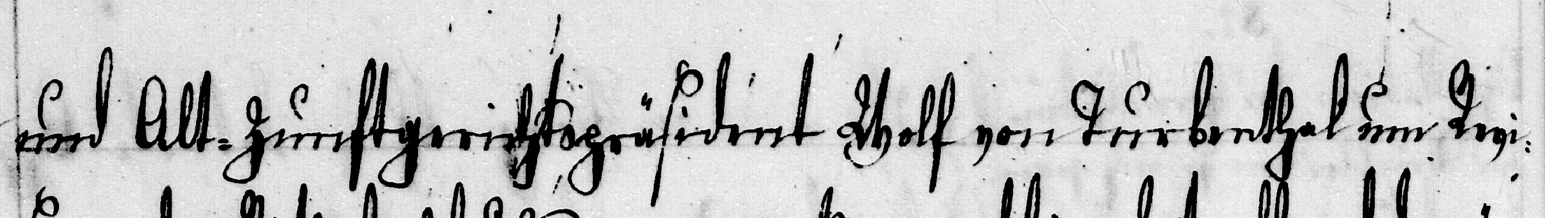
und Alt-Zunftgerichtspräsident Wolf von Turbenthal um Rev¬
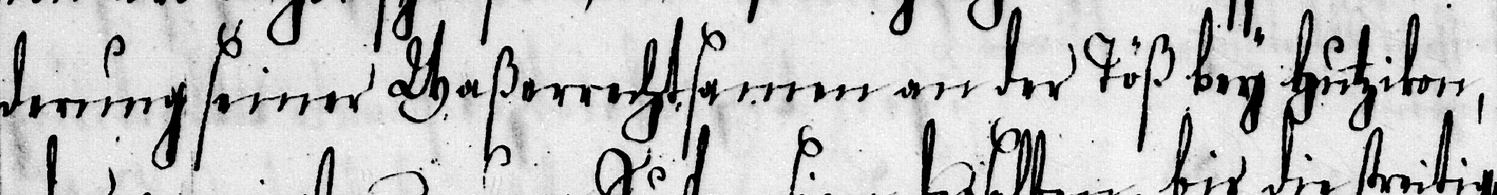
derung seiner Waßerrechtsamen an der Töß bey Hutzikon,
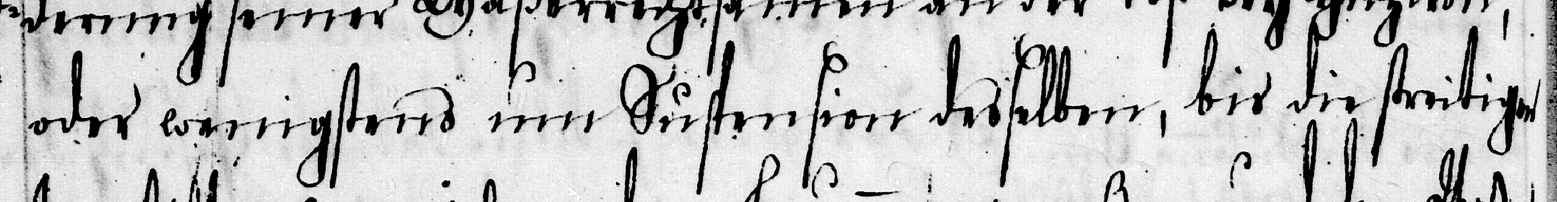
oder wenigstens um Suspension desselben, bis die streitigen
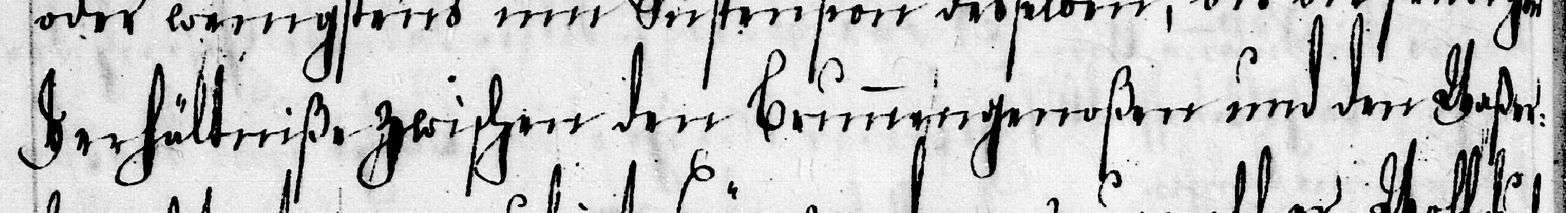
Verhältniße zwischen den Brunnengenoßen und den Waßer¬
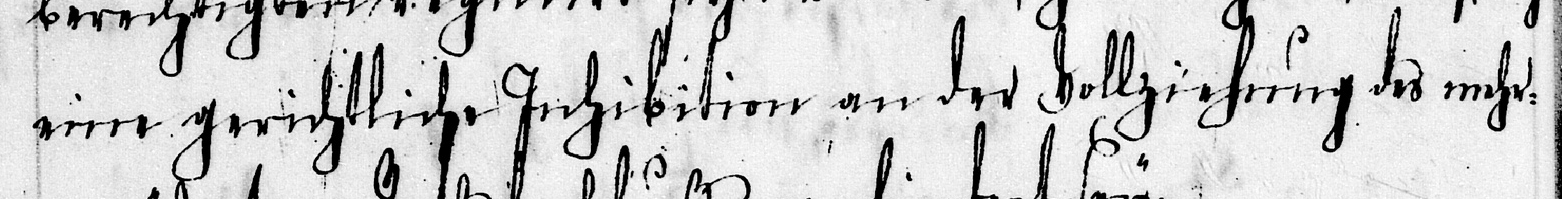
eine gerichtliche Inhibition an der Vollziehung des mehr¬
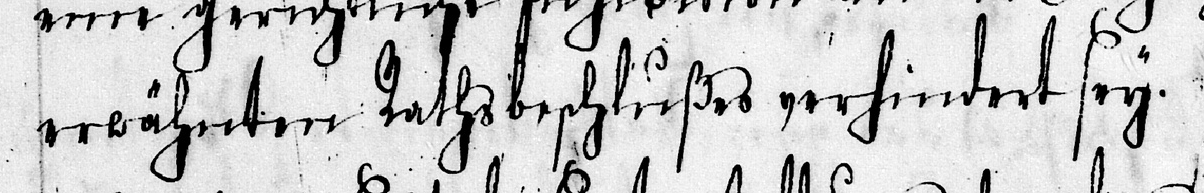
erwähnten Rathsbeschlußes verhindert sey.
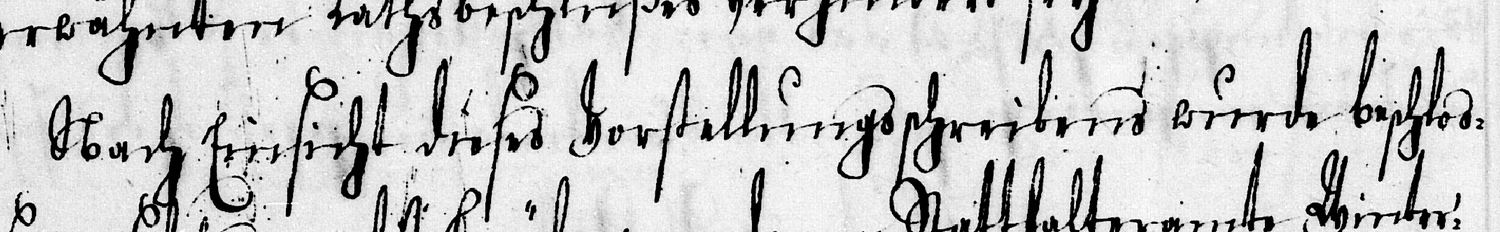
Nach Einsicht dieses Vorstellungsschreibens wurde beschlo¬
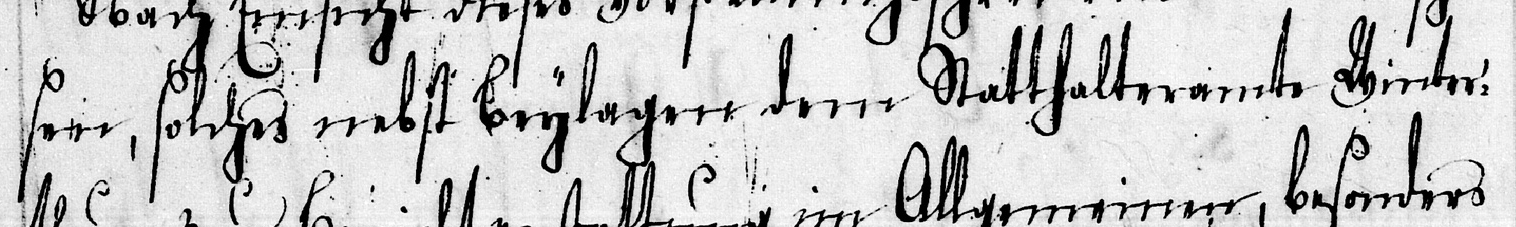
ßen, solches nebst Beylagen dem Statthalteramte Winter¬
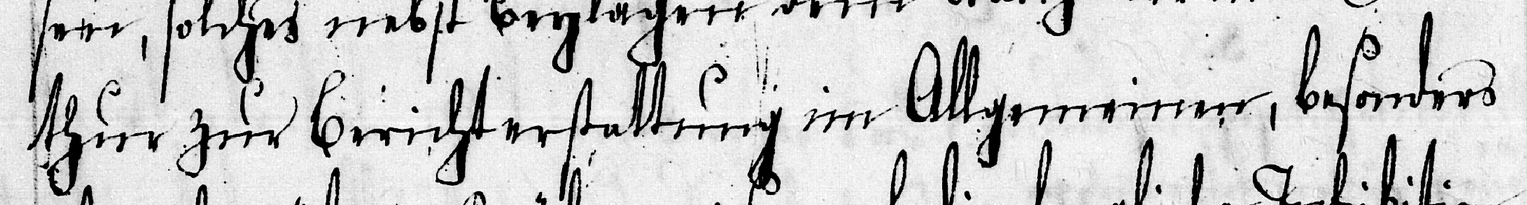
thur zur Berichterstattung im Allgemeinen, besonders
